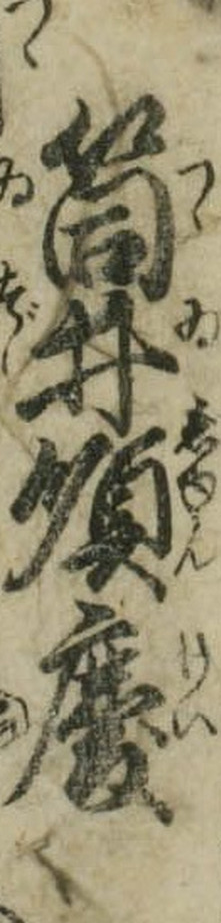筒井順慶
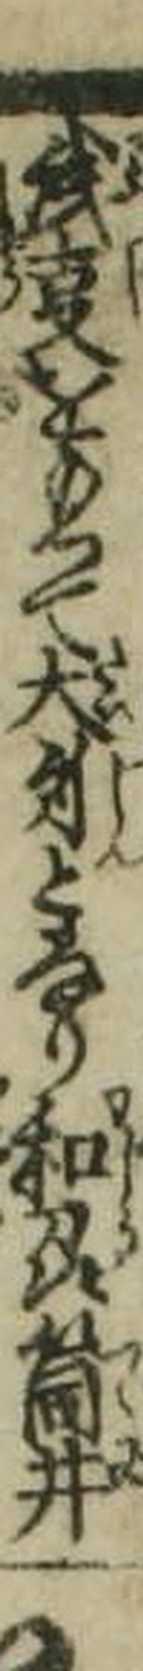武事をもつて大身となり和州筒井
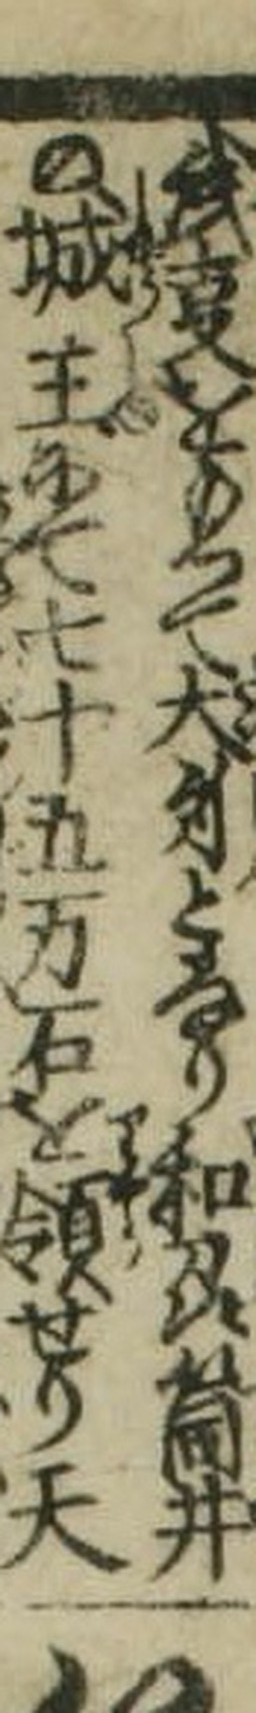の城主にて七十五万石を領せり天
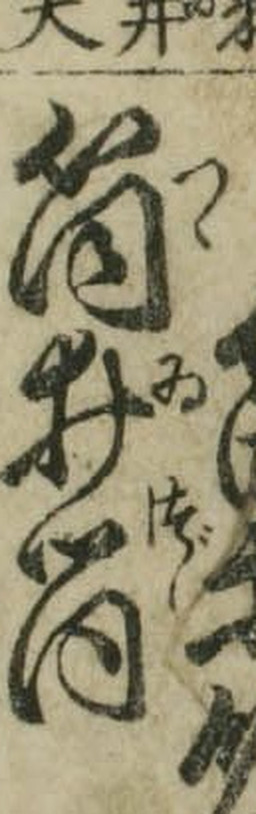筒井筒
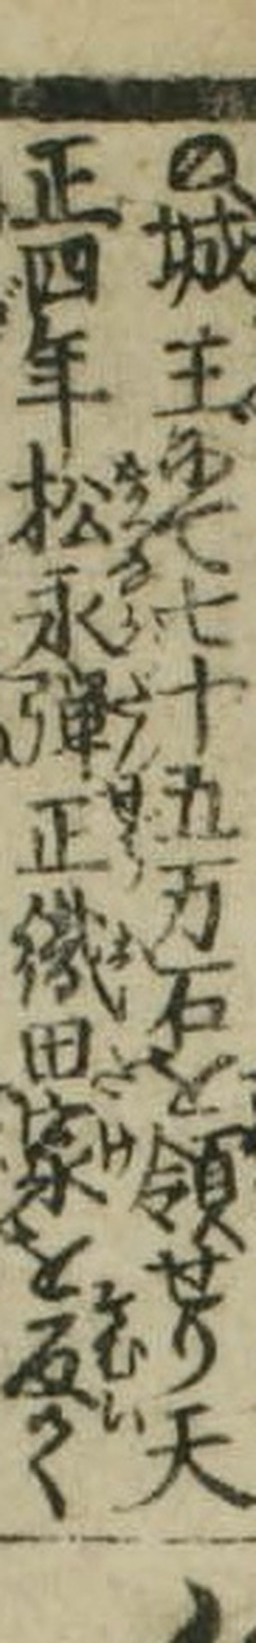正四年松永弾正織田家を反て
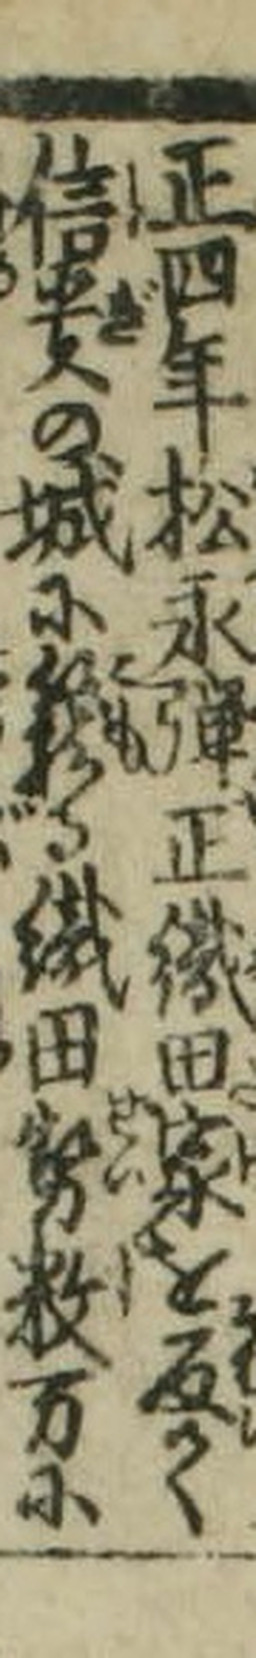信貴の城に籠る織田勢数万に
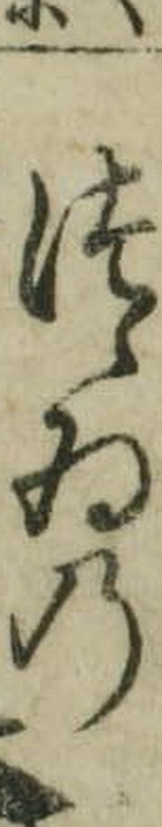つゝゐの
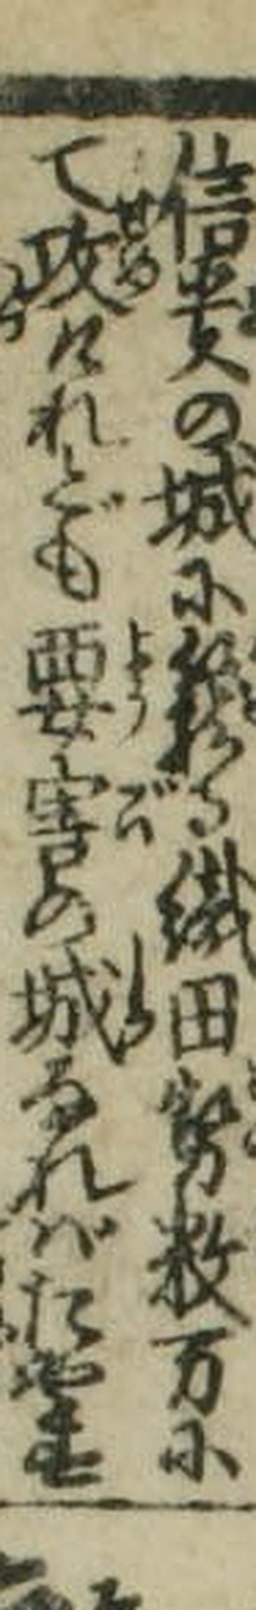て攻けれども要害の城なればたやす
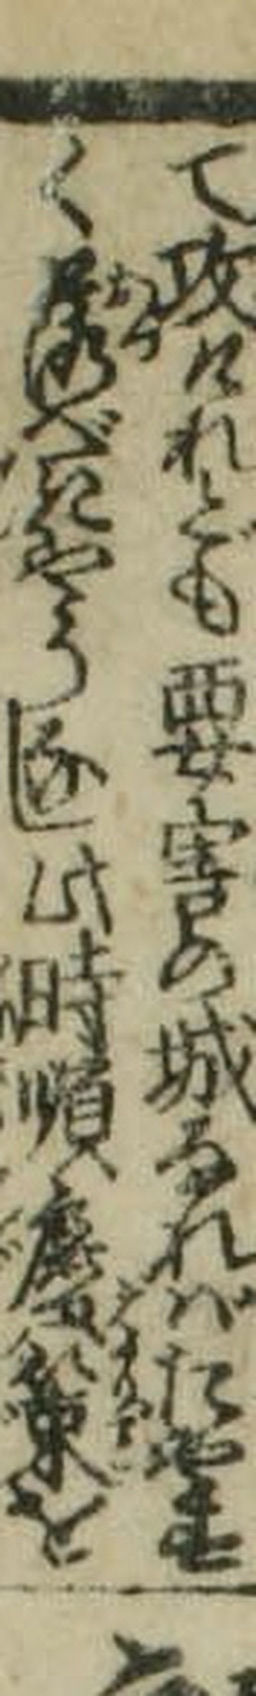く落べきやうなし此時順慶策を
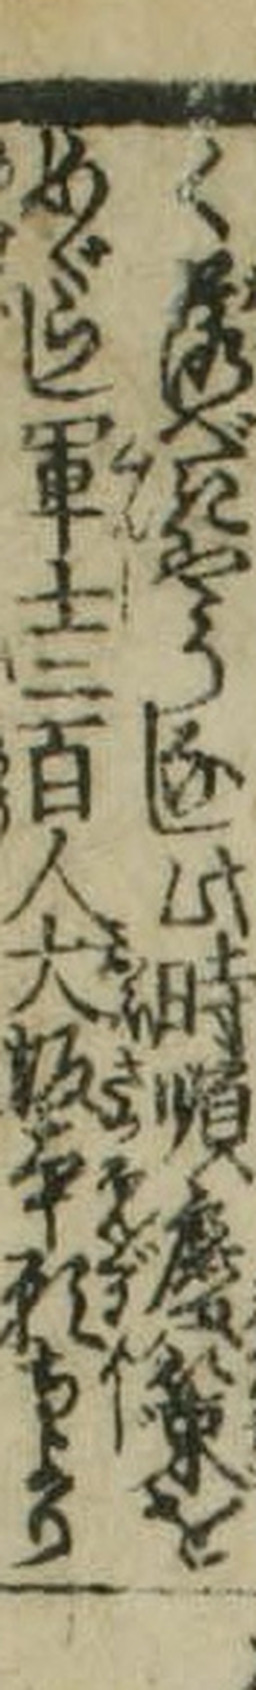めぐらし軍士二百人大坂本願寺より
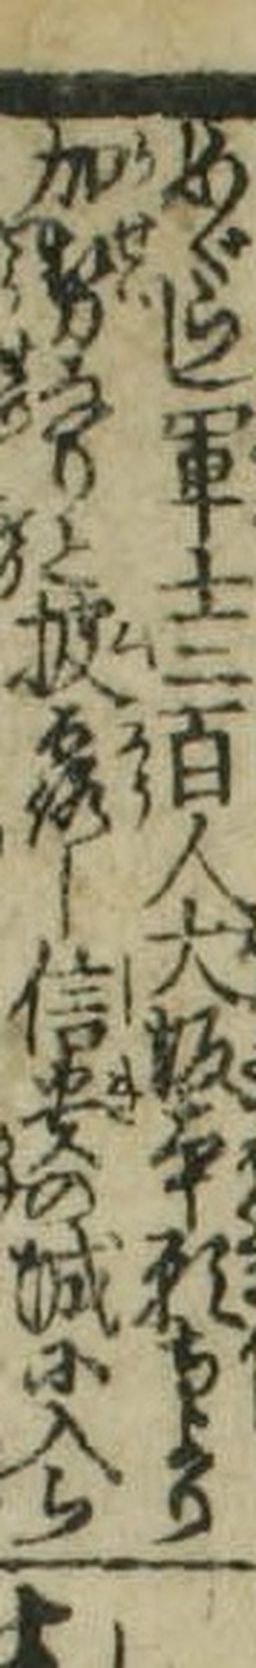加勢なりと披露し信貴の城に入ら
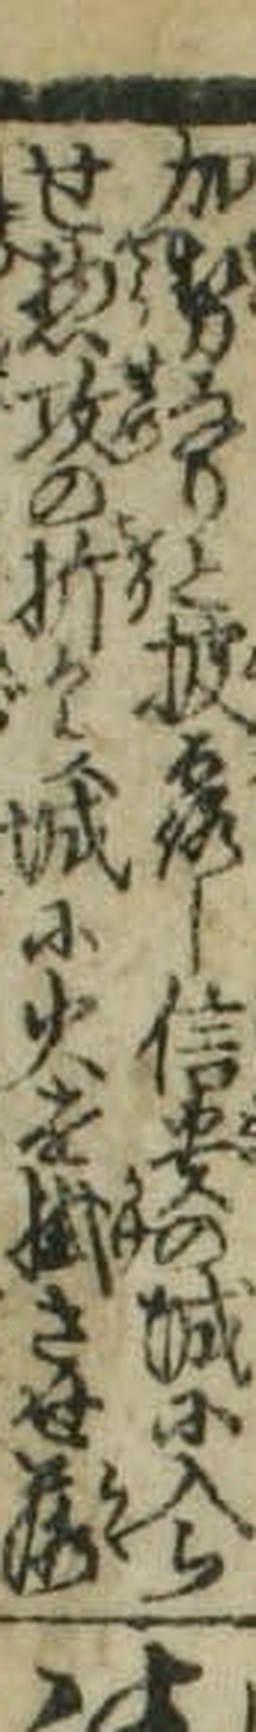せ惣攻の折から城に火を掛させ落
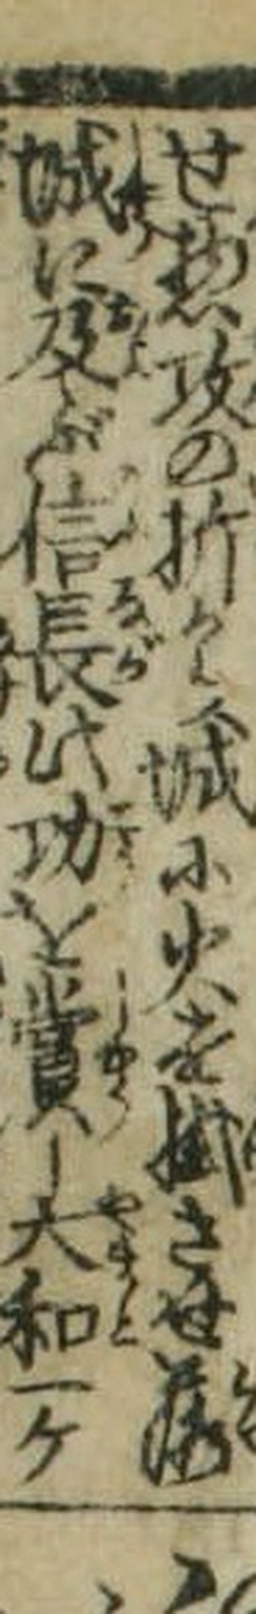城に及ぶ信長此功を賞し大和一ヶ
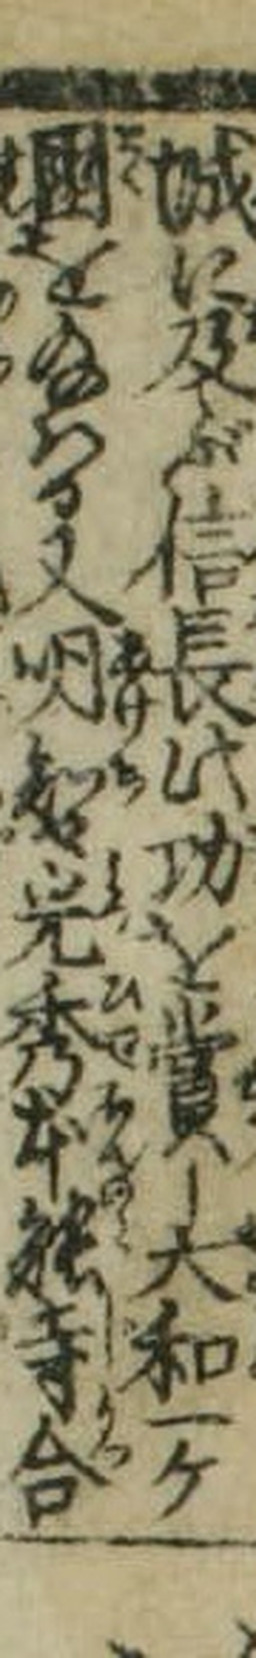国を給はる又明智光秀本能寺合
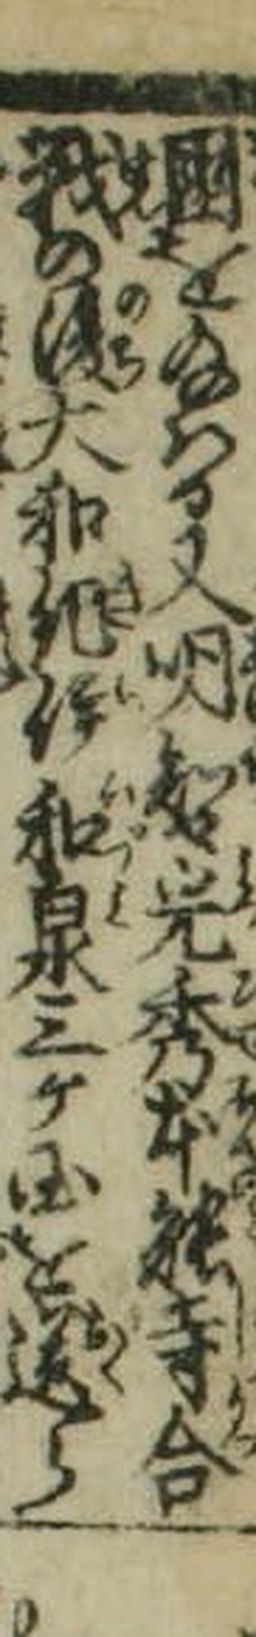戦の後大和紀伊和泉三ヶ国を送ら
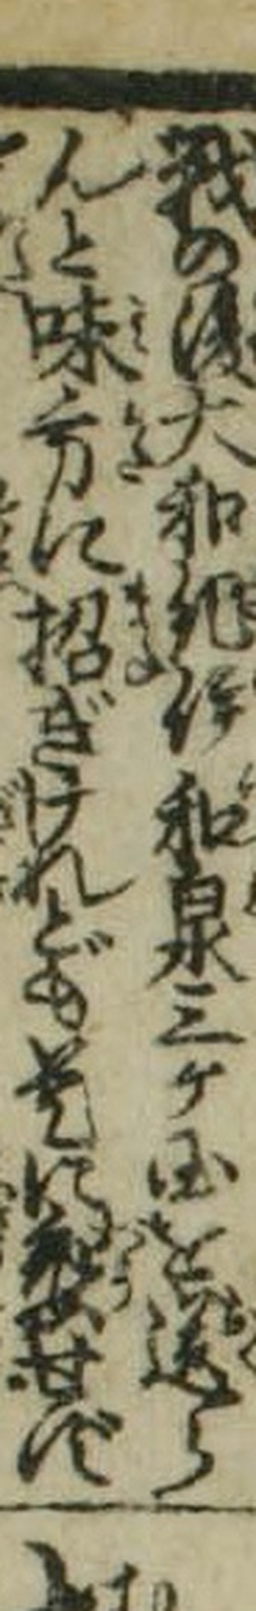んと味方に招ぎけれども是に応せず
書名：續英雄百人一首
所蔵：東京学芸大学附属図書館
